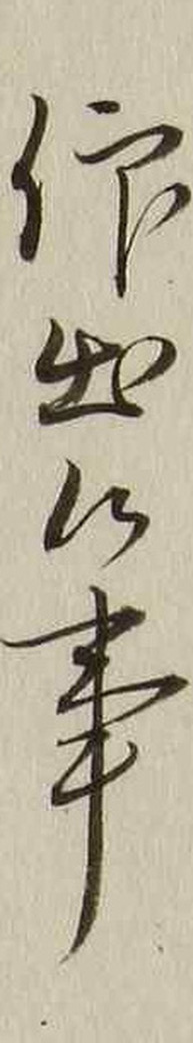仰出候事
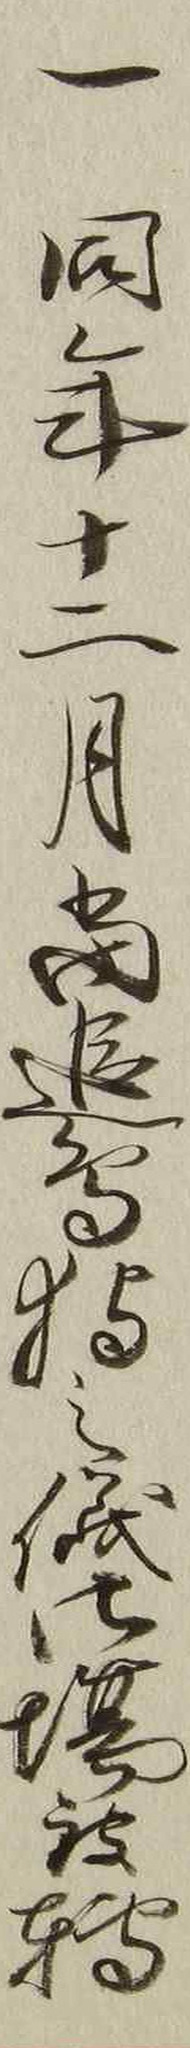一同年十二月当追鳥狩之儀御場被転
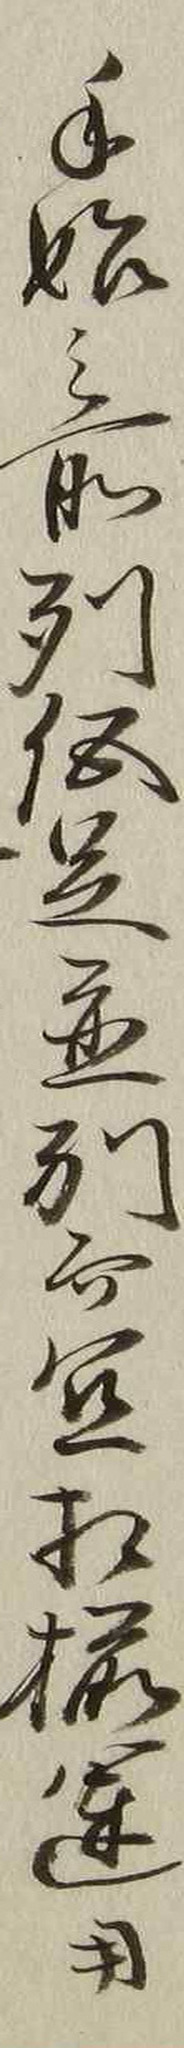手始之所列伍足並別而宜相揃運用
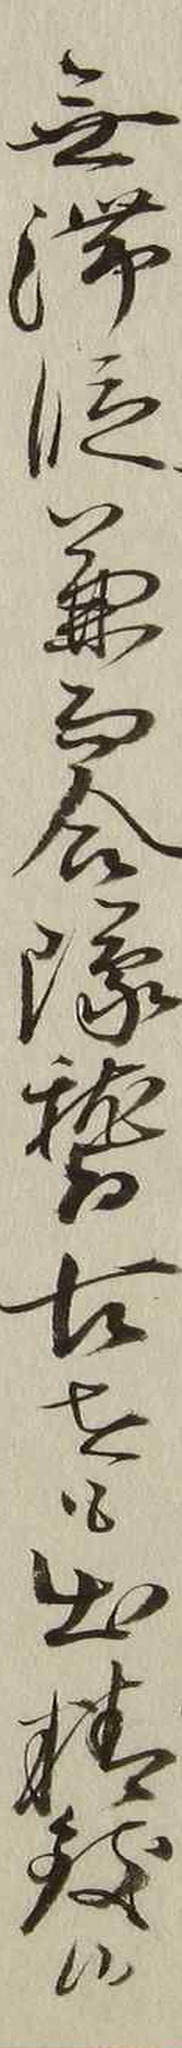無滞段兼而合隊稽古をも出精致候
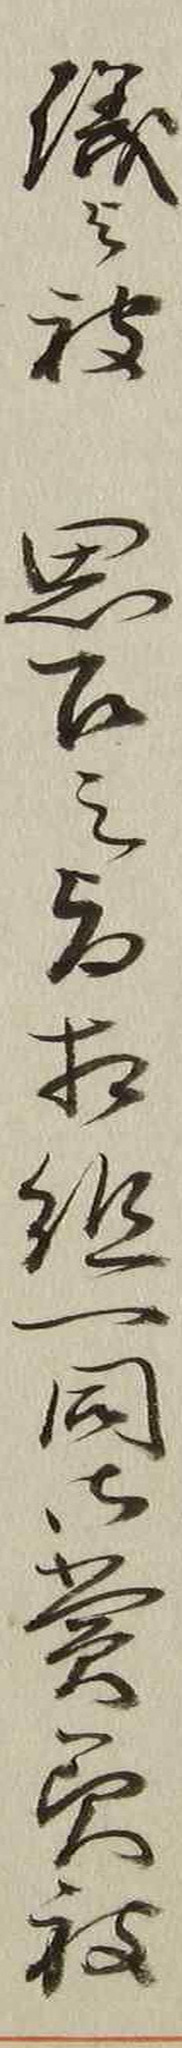儀と被思召之旨相組一同御賞美被
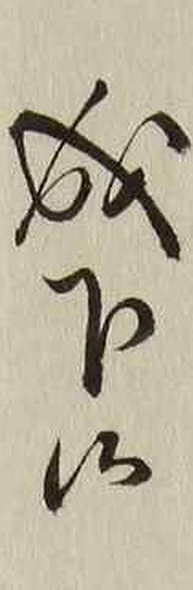成下候
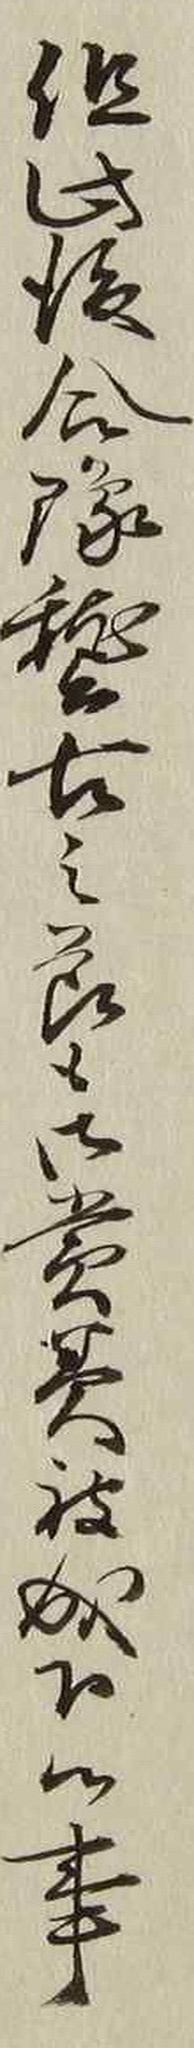但此後合隊稽古之節も御賞美被成下候事
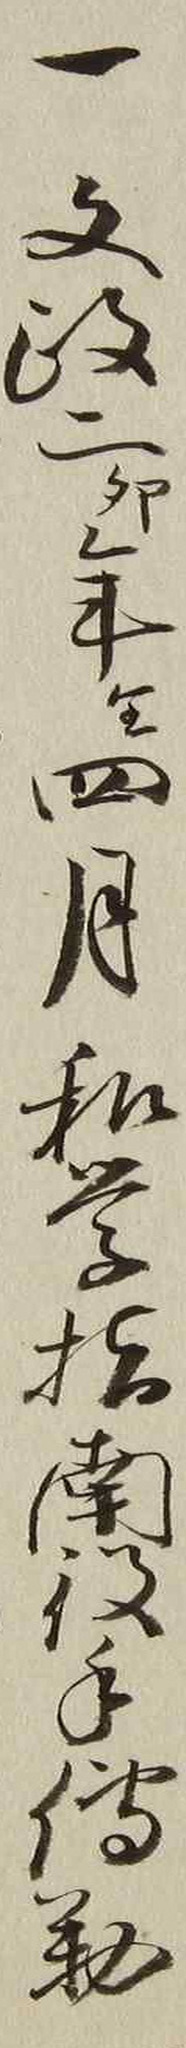一文政二卯年閏四月和学指南役手伝勤
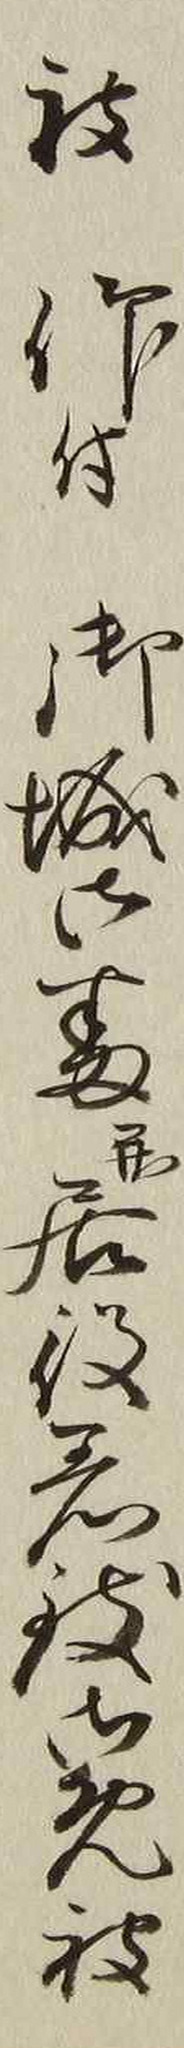被仰付御城御番并居役着致御免被
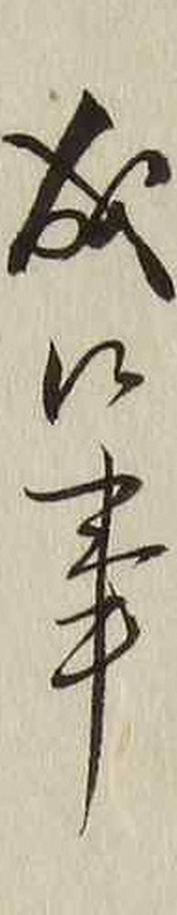成候事
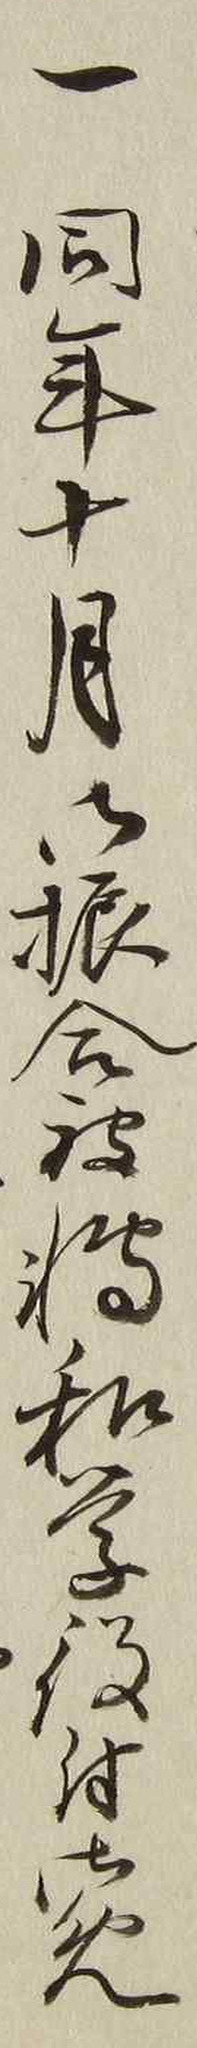一同年十月御振合被転和学役付御免
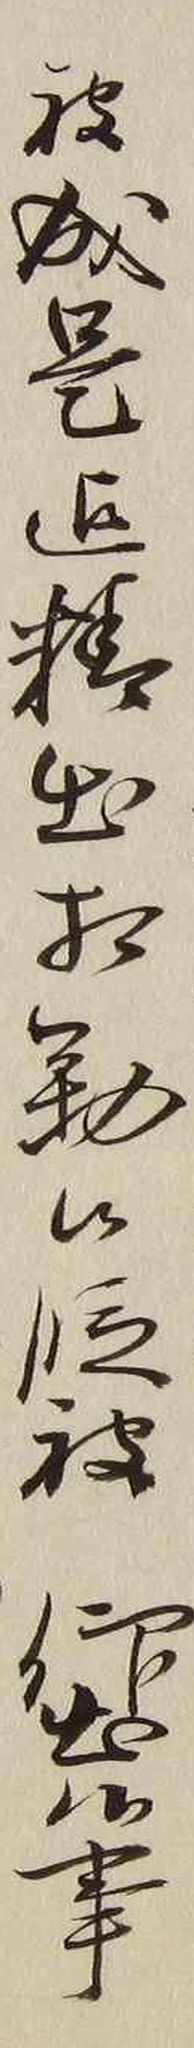被成是迄精出相勤候段被仰出候事
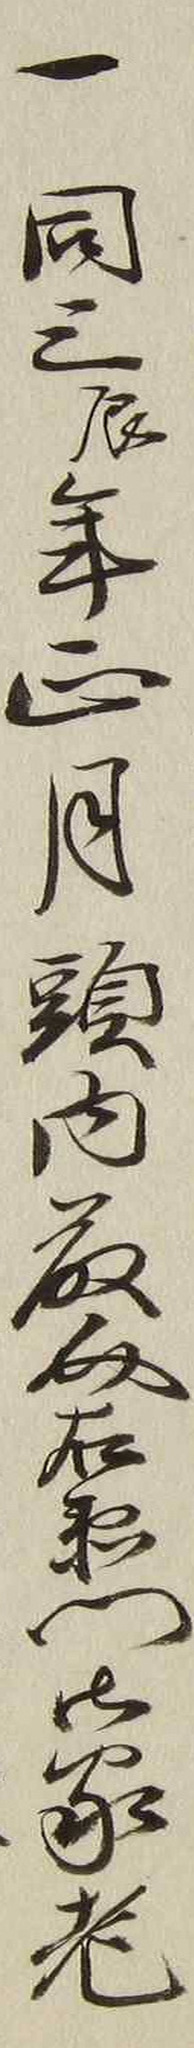一同三辰年正月頭内藤介右衛門御家老
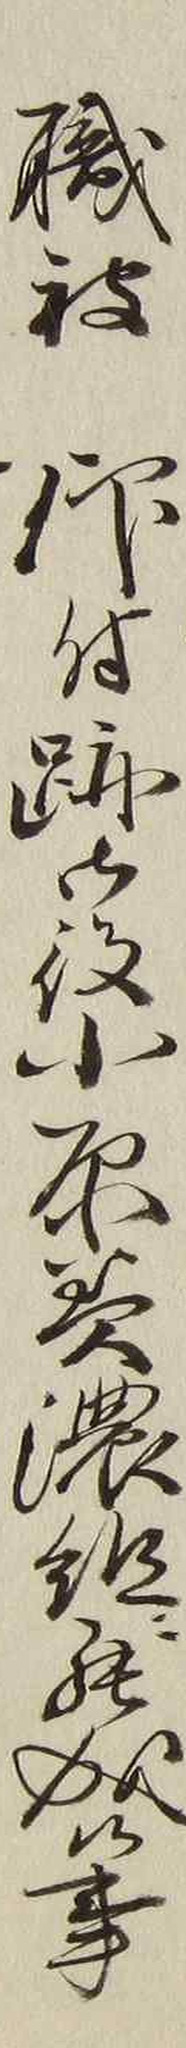職被仰付跡御役小原美濃組に罷成候事
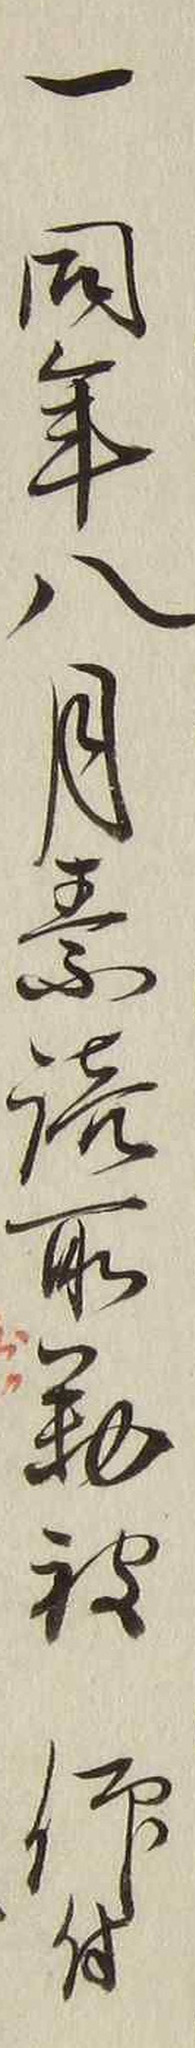一同年八月素読所勤被仰付

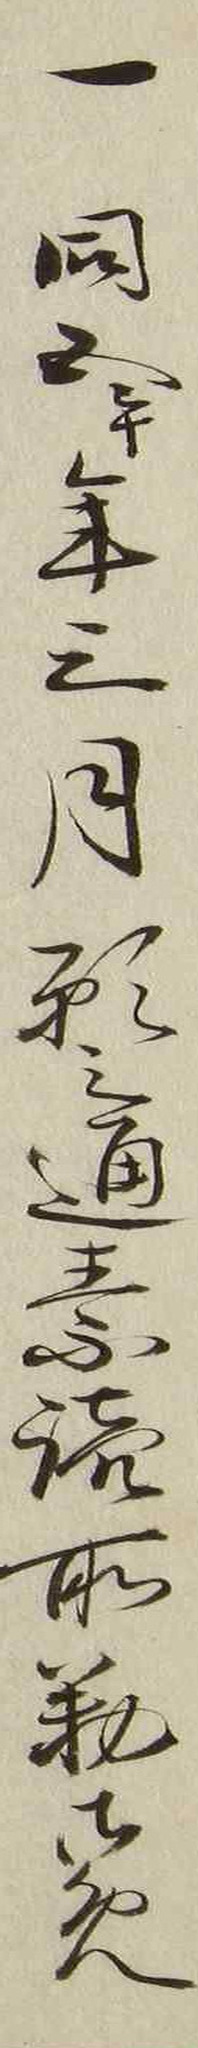一同五午年三月願之通素読所勤御免
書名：諸士系譜　巻之157　ね之部1
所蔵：会津若松市立会津図書館
